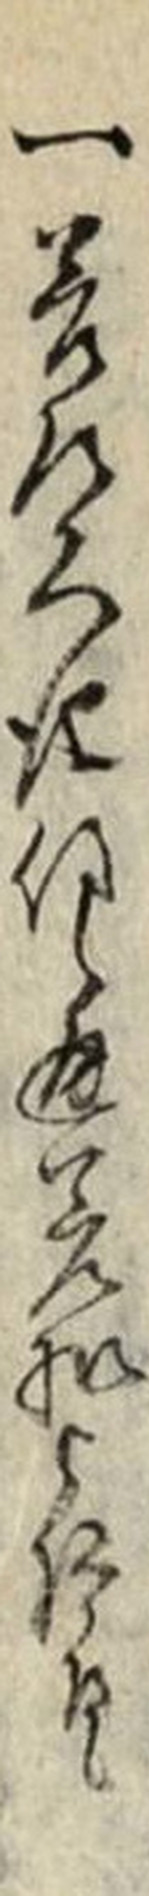一善左衛門儀伺之通指扣被仰付候
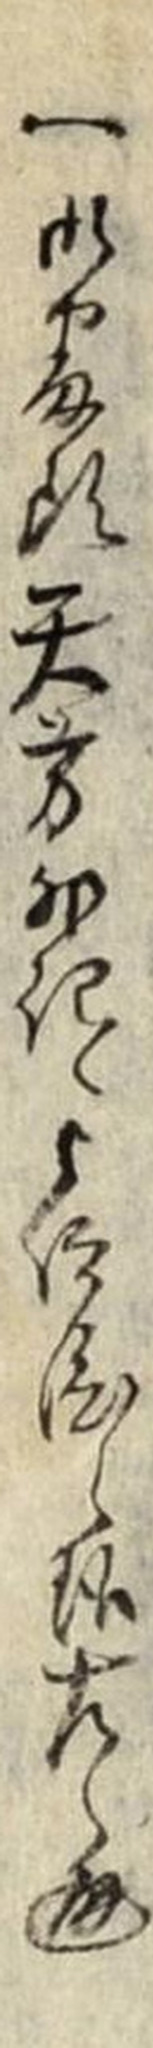一御番頭天方外記へ被仰渡候趣左之通
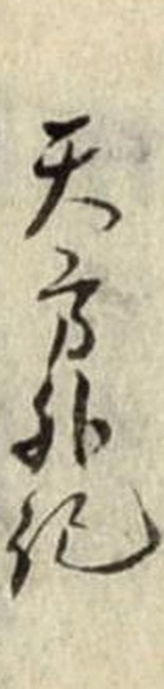天方外記
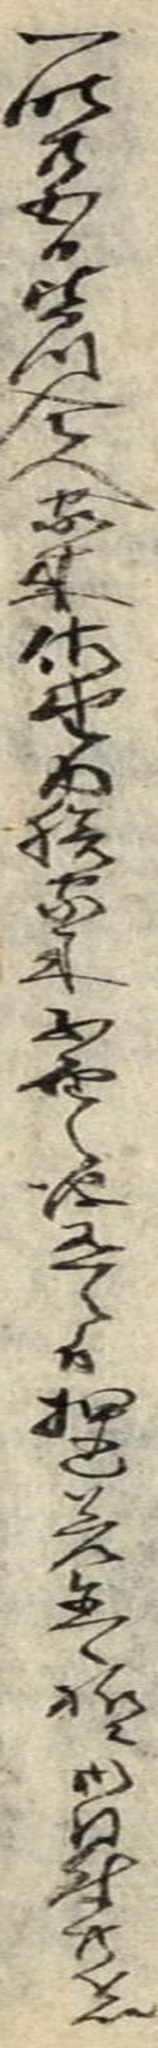一昨廿五日皆川舎人家来佐野内膳家来不届之儀有之候に付押込差置候様に御目付共を以
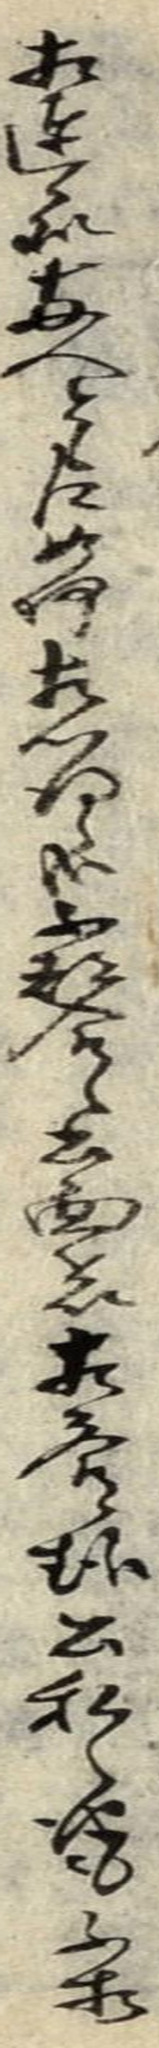相達候処両人ともに如何相心得候哉不都合之書面を以相答候趣公私之儀も不相
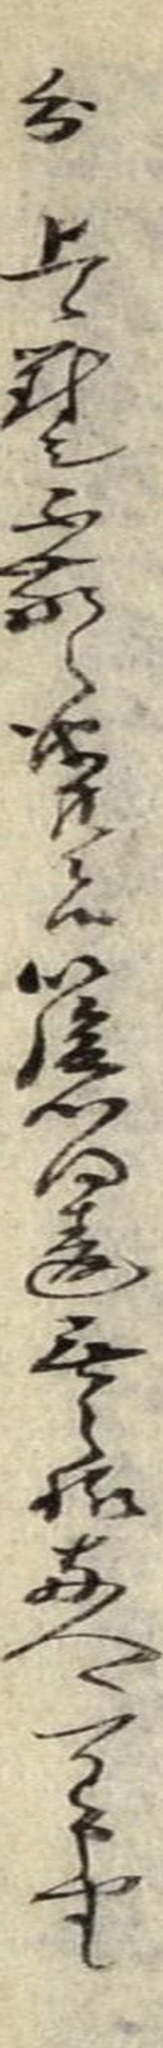分上へ対し不慶之儀共に候以後心得違無之様両人へ可被申聞候
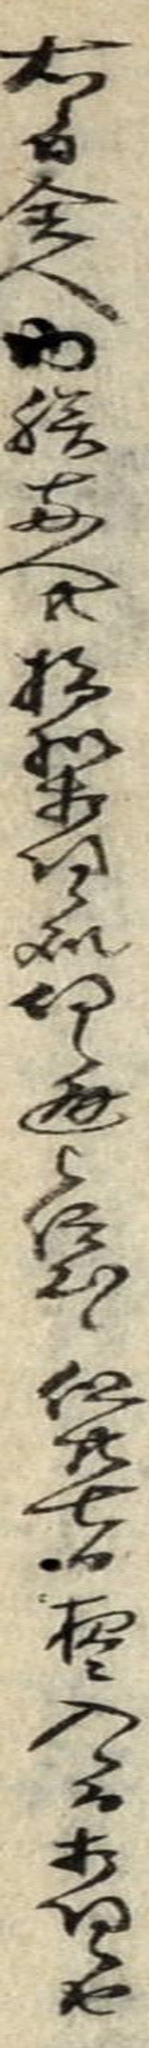右に付舎人内膳両人共指扣相伺候処伺之通被仰出候但廿七日夜に入候而相伺候由
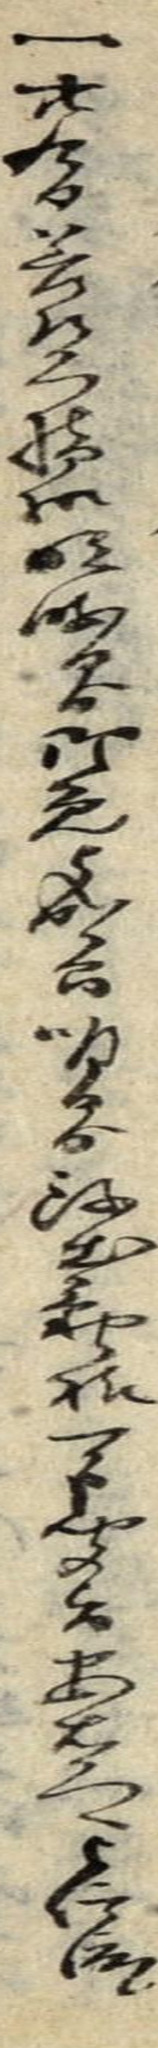一廿九日善左衛門指扣明朔日ゟ御免被成候間明日ゟ致出勤候様可申聞候旨安右衛門へ被仰渡候
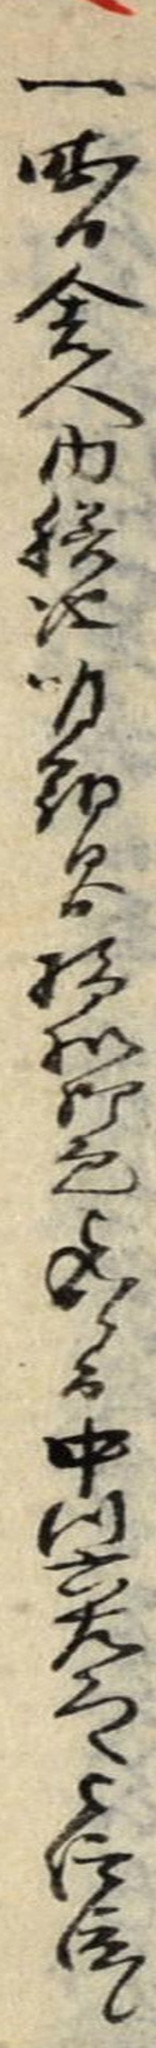一晦日舎人内膳儀明朔日ゟ指扣御免被成候付中川六左衛門へ被仰渡候

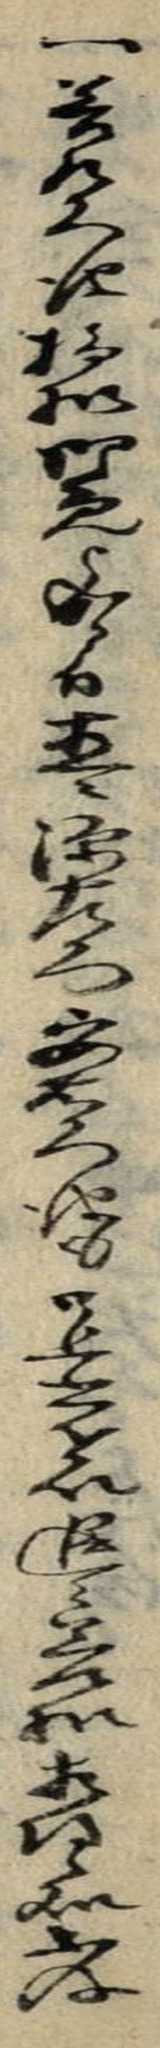一善左衛門儀指扣御免被成候に付直々源左衛門安右衛門儀も口上書を以追々差扣相伺候処不及
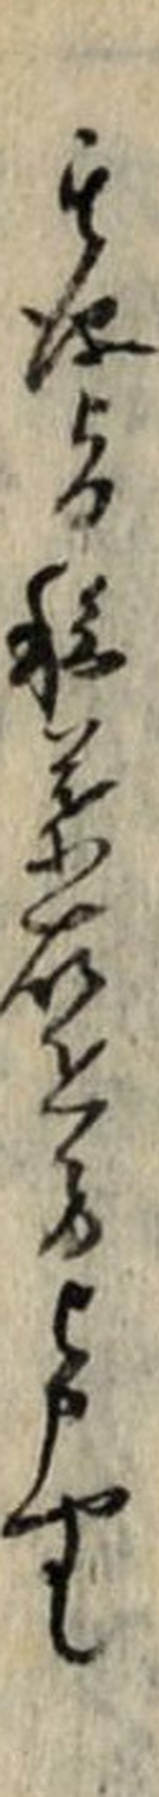其儀旨稻葉右近方被申聞候
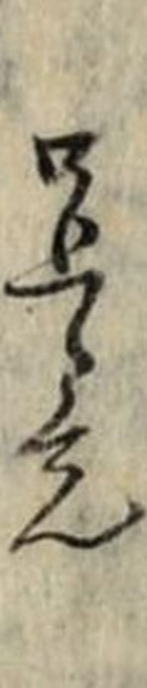口上之覚
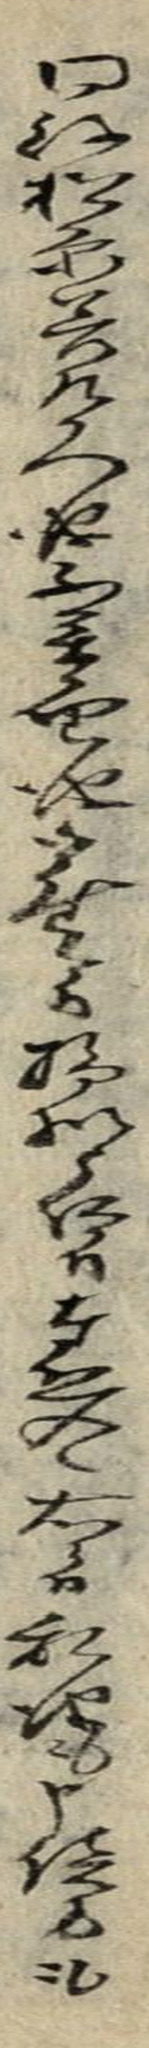同役松原善左衛門儀不参届儀御座候付指扣被仰付奉恐入候右に付私儀も申談方も
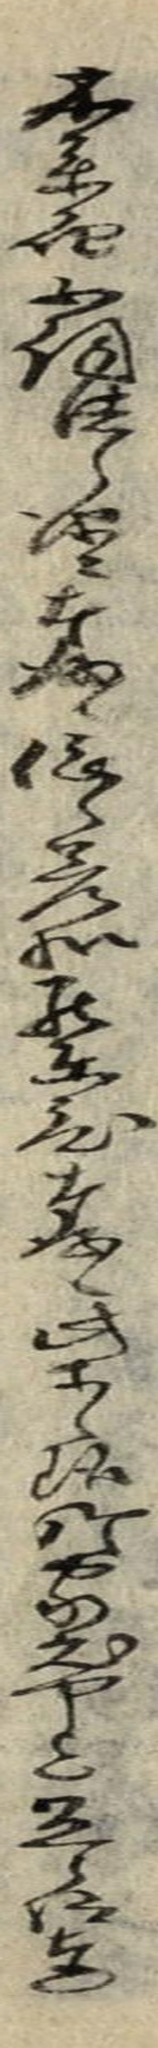不参届不調法之儀に奉存候依之差扣罷在度奉存候此等之趣御家老中迄宜被仰達
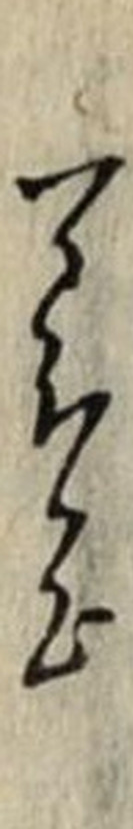可被下候以上
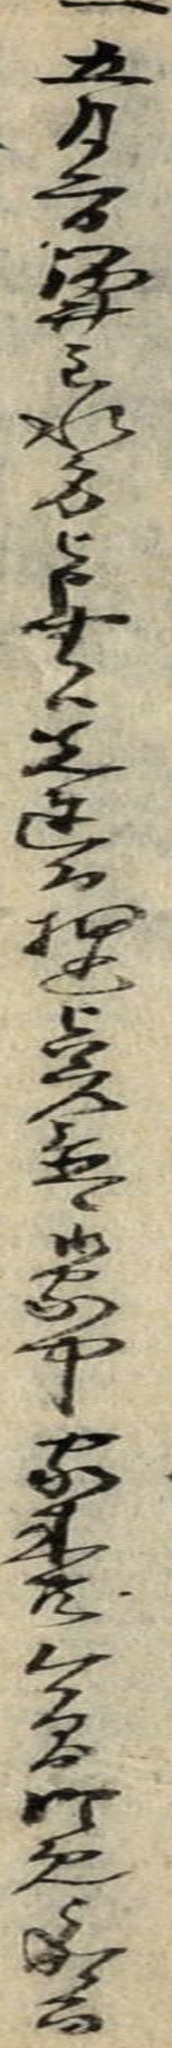一五月二日酒井主水方被申聞候は先達而押込差置候御家中家来共今日ゟ御免被成候間
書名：蒐輯之部
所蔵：福井県文書館 Fukui Prefectural Archives
